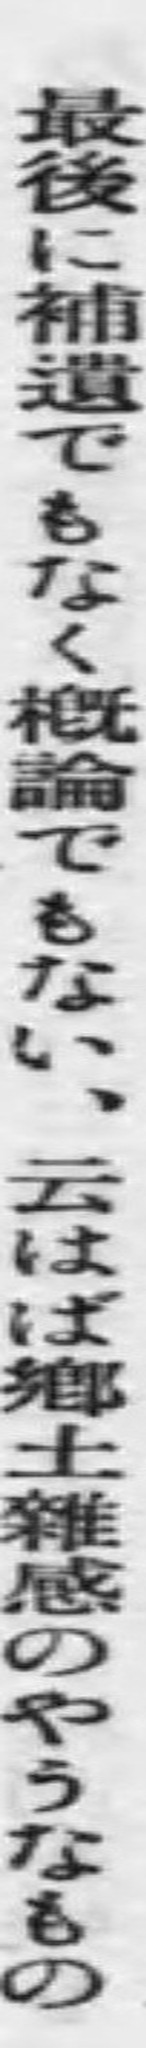最後に補遺でもなく概論でもない、云はば郷土雑感のやうなもの
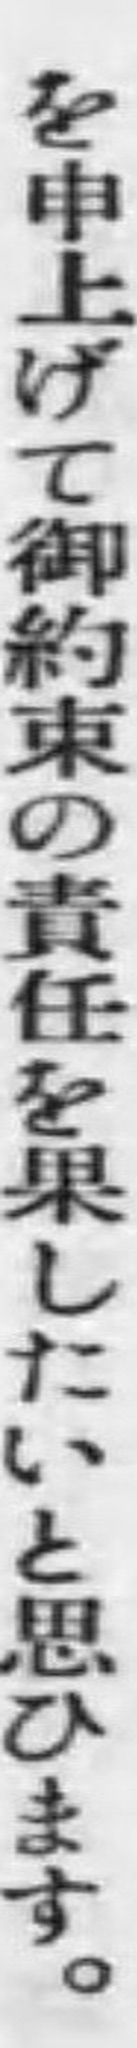を申上げて御約束の責任を果したいと思ひます。
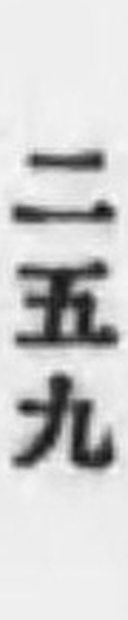二五九

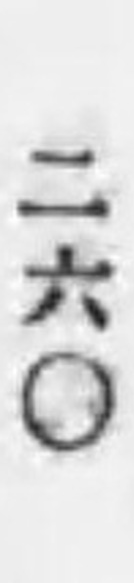二六〇
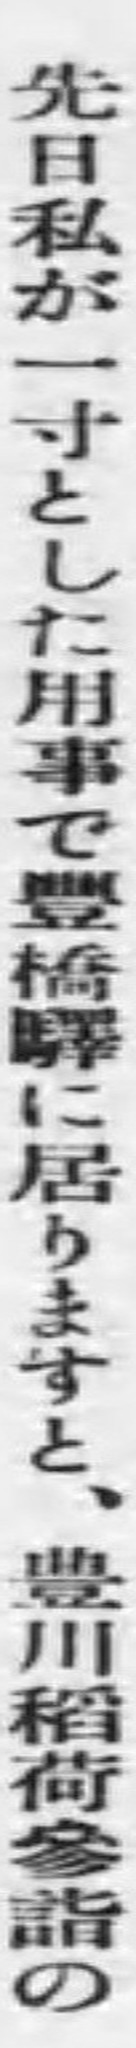先日私が一寸とした用事で豊橋駅に居りますと、豊川稲荷参詣の
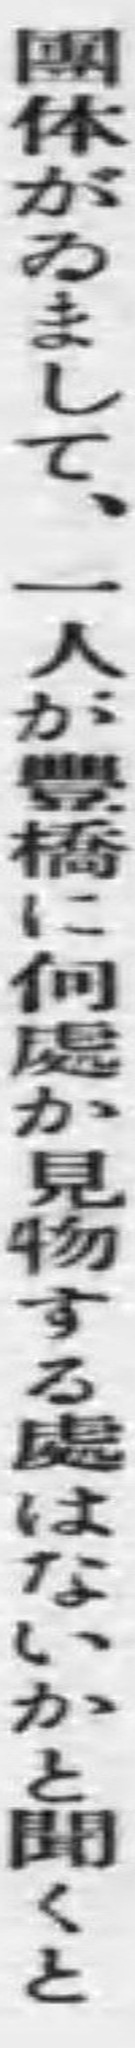団体がゐまして、一人が豊橋に何処か見物する処はないかと聞くと
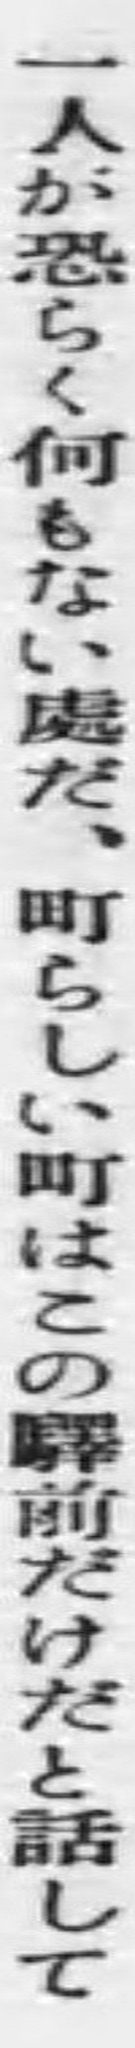一人が恐らく何もない処だ、町らしい町はこの駅前だけだと話して
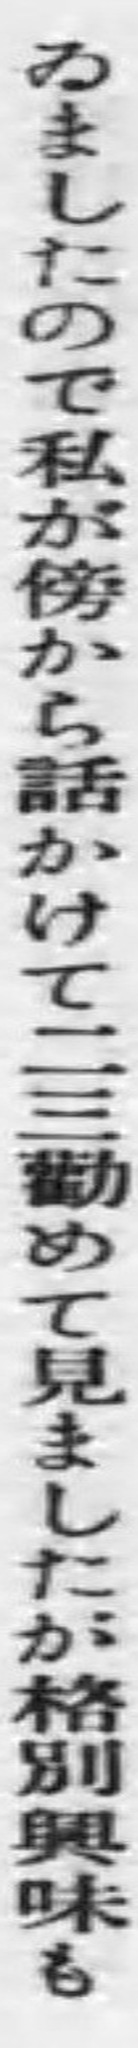ゐましたので私が傍から話かけて二三勧めて見ましたが格別興味も
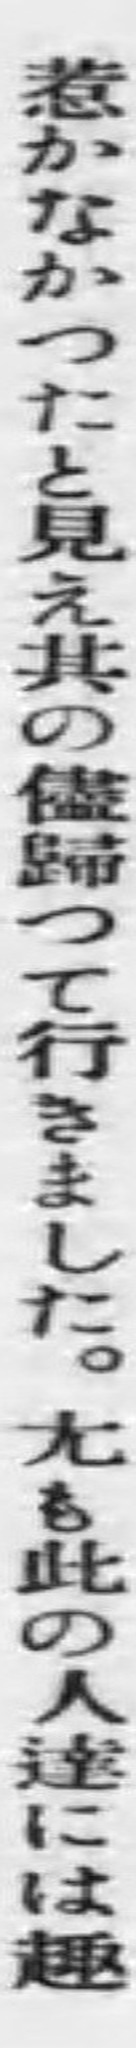惹かなかつたと見え其の侭帰つて行きました。尢も此の人達には趣
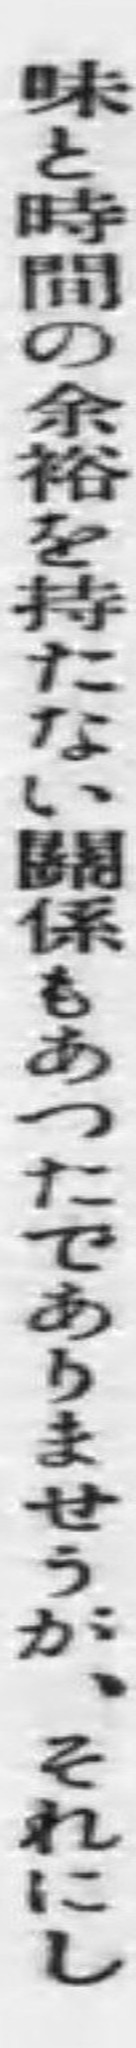味と時間の余裕を持たない関係もあつたでありませうが、それにし
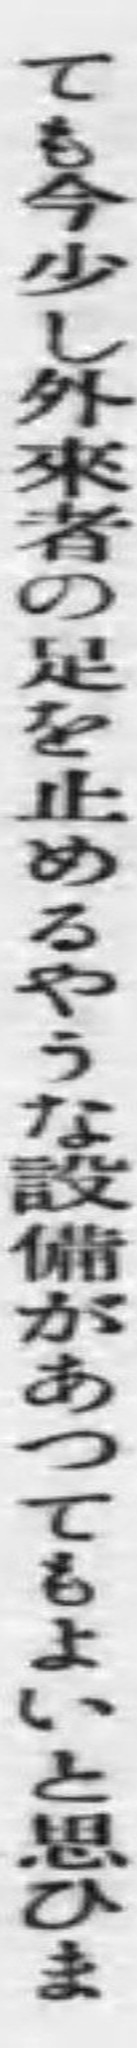ても今少し外来者の足を止めるやうな設備があつてもよいと思ひま
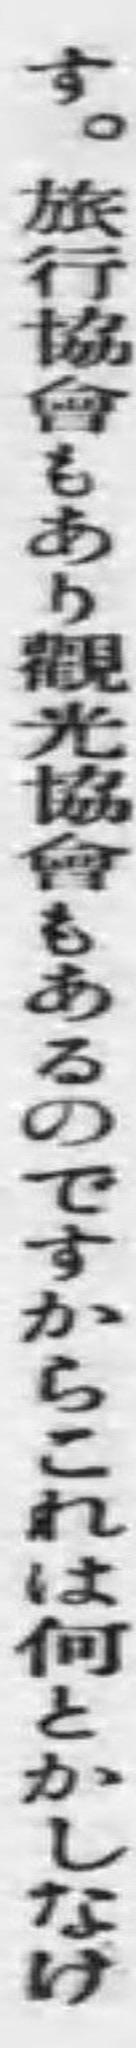す。旅行協会もあり観光協会もあるのですからこれは何とかしなけ
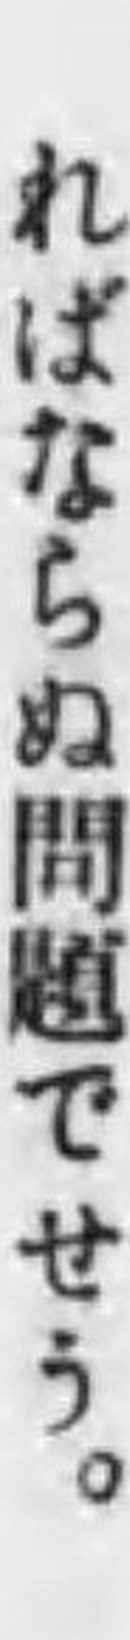ればならぬ問題でせう。
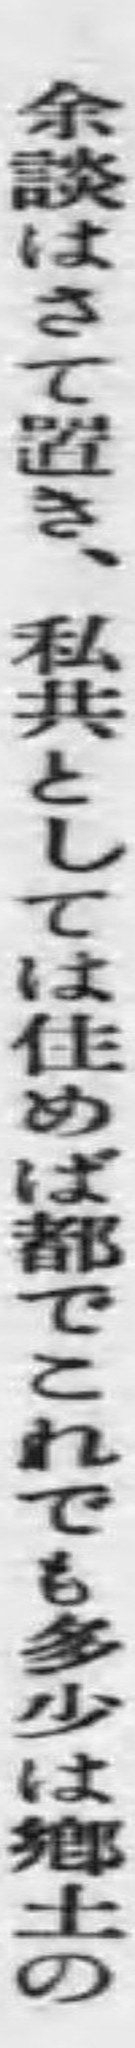余談はさて置き、私共としては住めば都でこれでも多少は郷土の
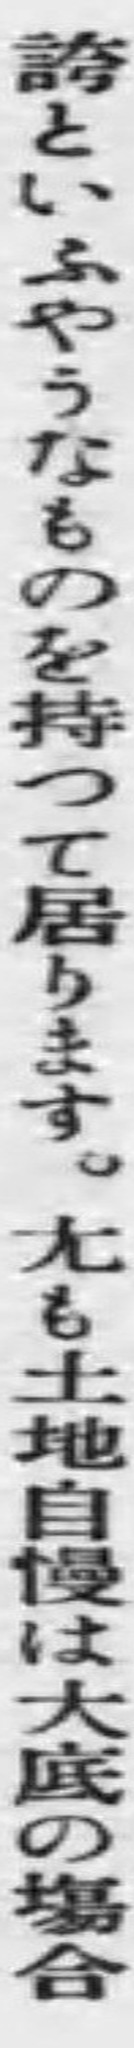誇といふやうなものを持つて居ります。尢も土地自慢は大底の場合
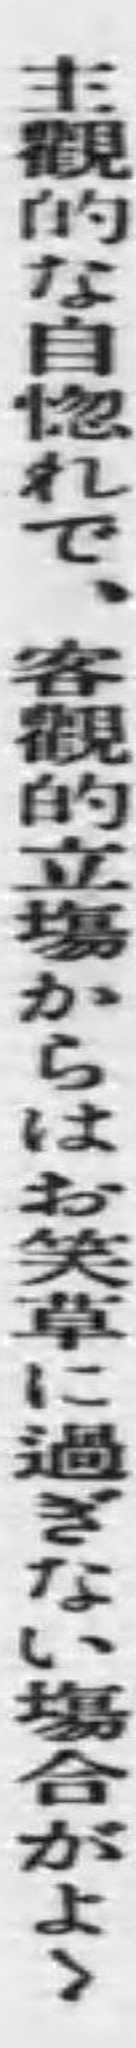主観的な自惚れで、客観的立場からはお笑草に過ぎない場合がよく
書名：東三河道中記 : 豊橋市及其附近案内
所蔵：国立国会図書館 National Diet Library, JAPAN
